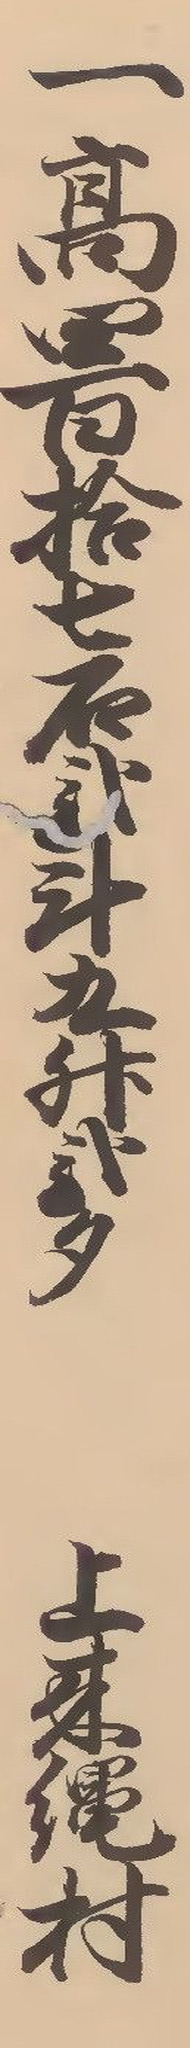一高四百拾七石弐斗九升弐勺上来縄村

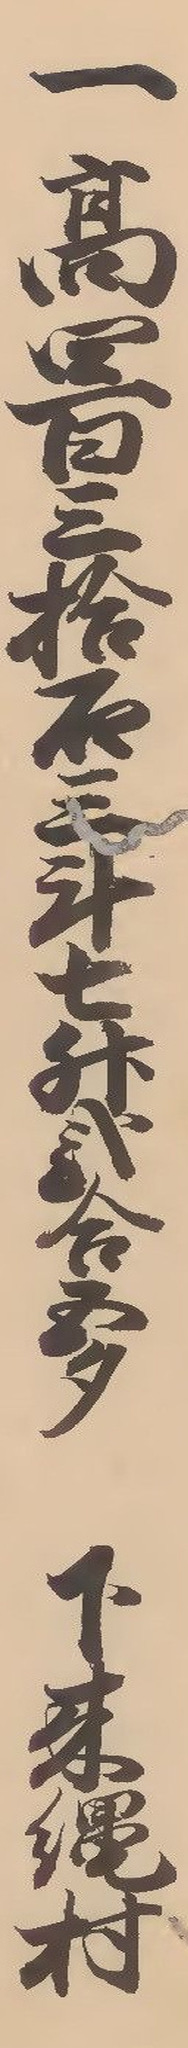一高四百三拾石三斗七升弐合五勺下来縄村
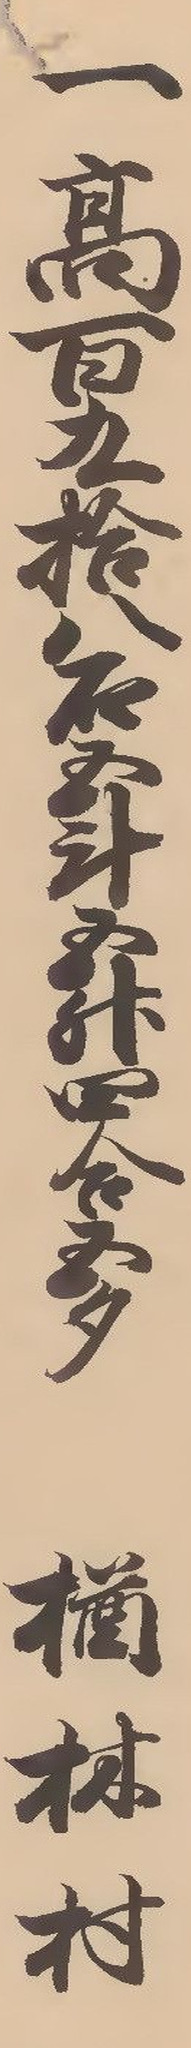一高百九拾八石五斗五升四合五勺楢林村
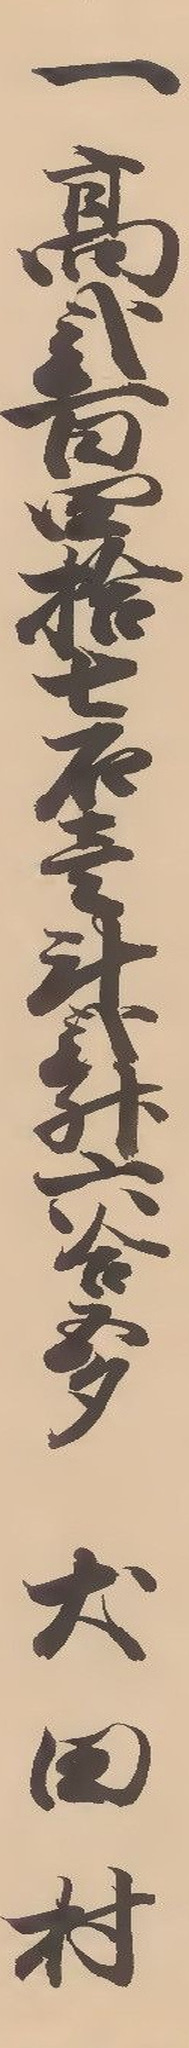一高弐百四拾七石壱斗弐升六合五勺犬田村
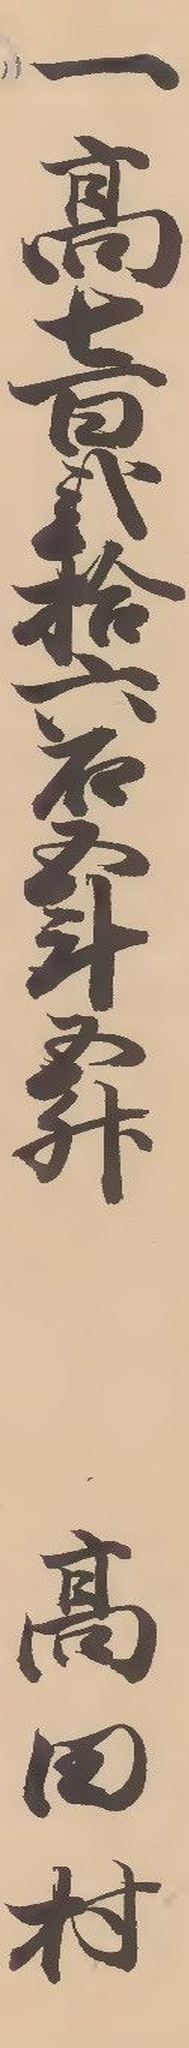一高七百弐拾六石五斗五升高田村
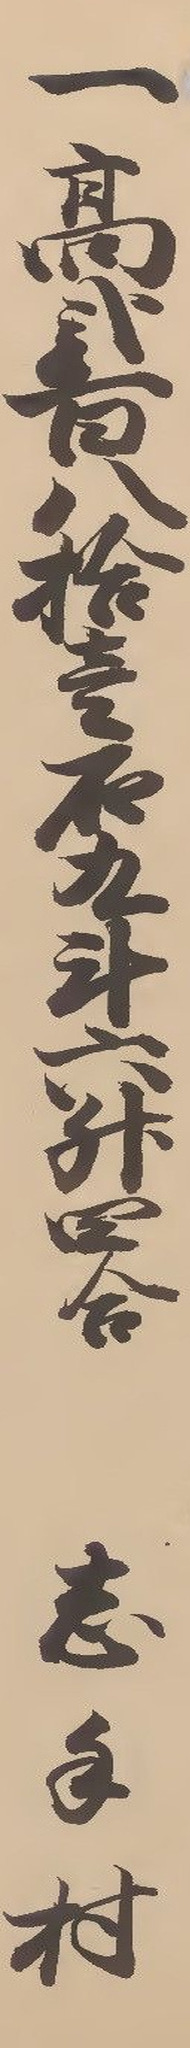一高弐百八拾壱石九斗六升四合志手村
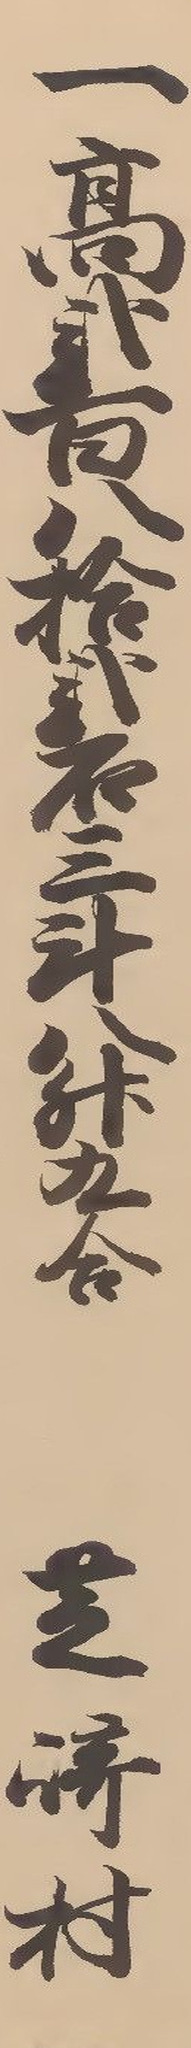一高弐百八拾弐石三斗八升九合芝崎村
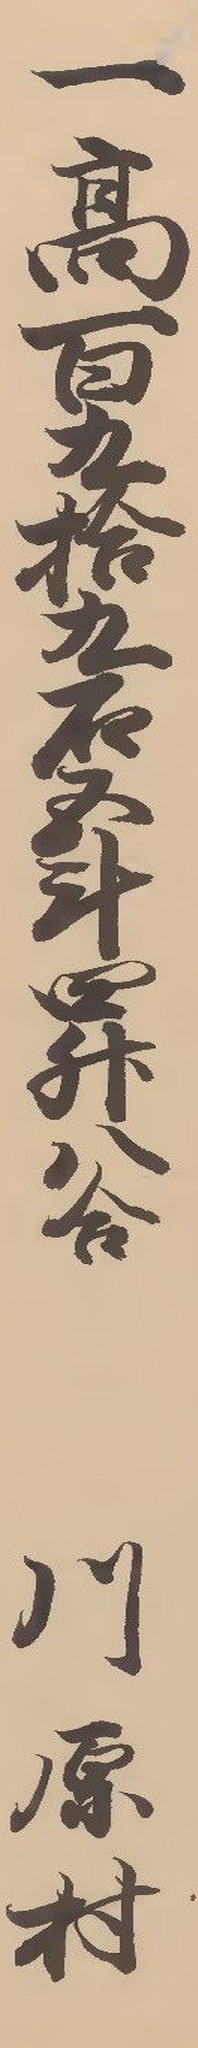一高百九拾九石五斗四升八合川原村
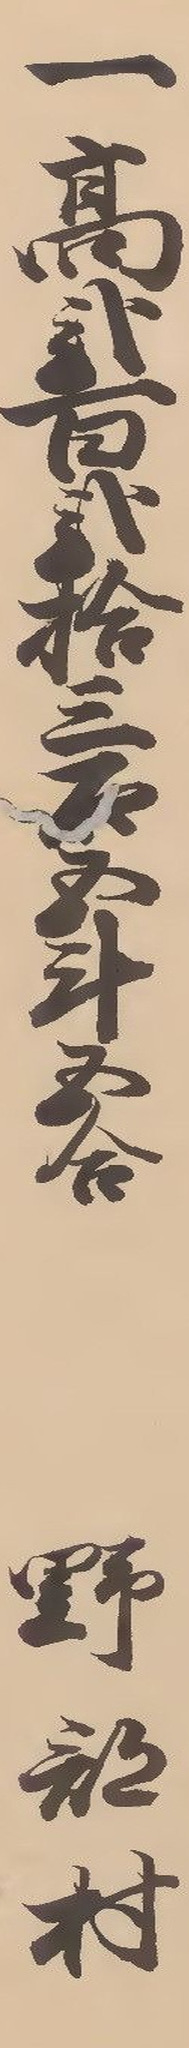一高弐百弐拾三石五斗五合野部村

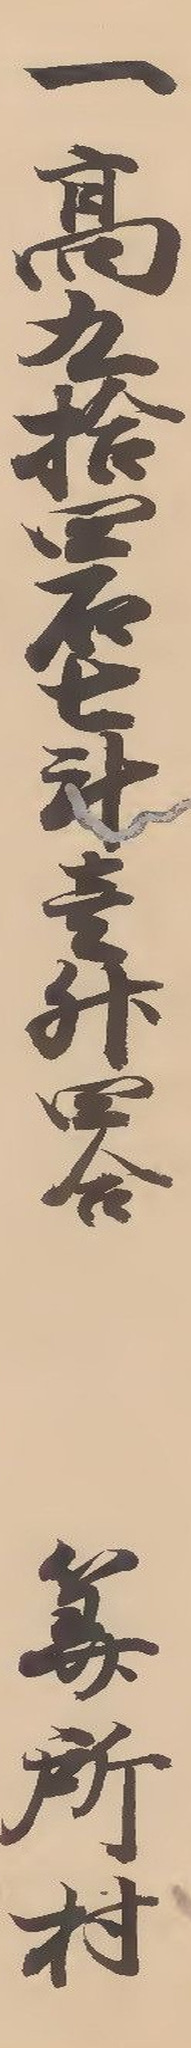一高九拾四石七斗壱升四合算所村
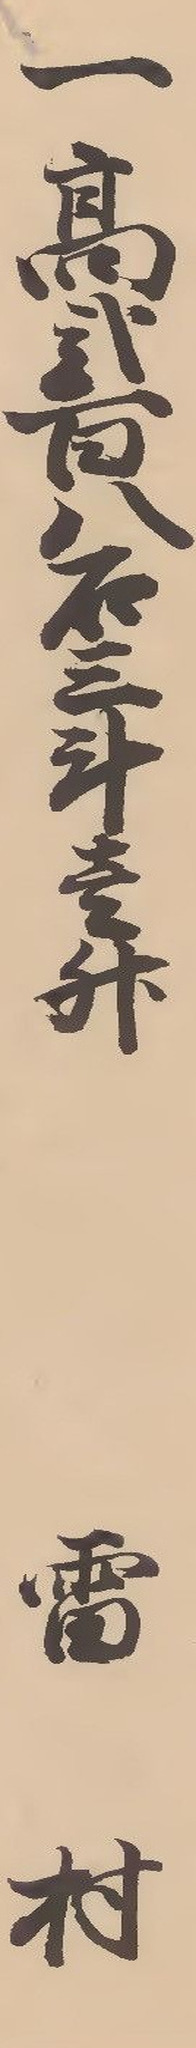一高弐百八石三斗壱升雷村
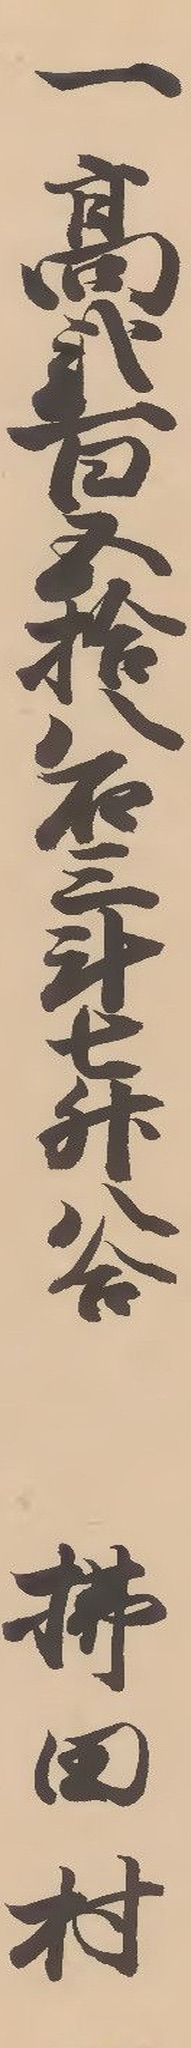一高弐百五拾八石三斗七升八合払田村
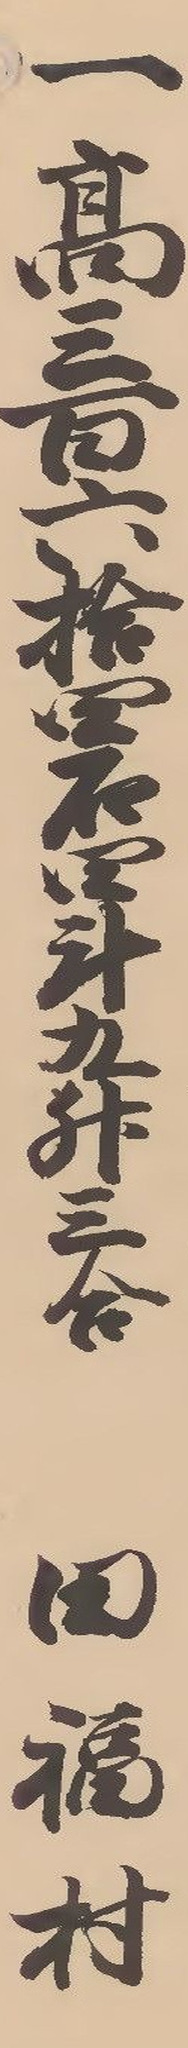一高三百六拾四石四斗九升三合田福村
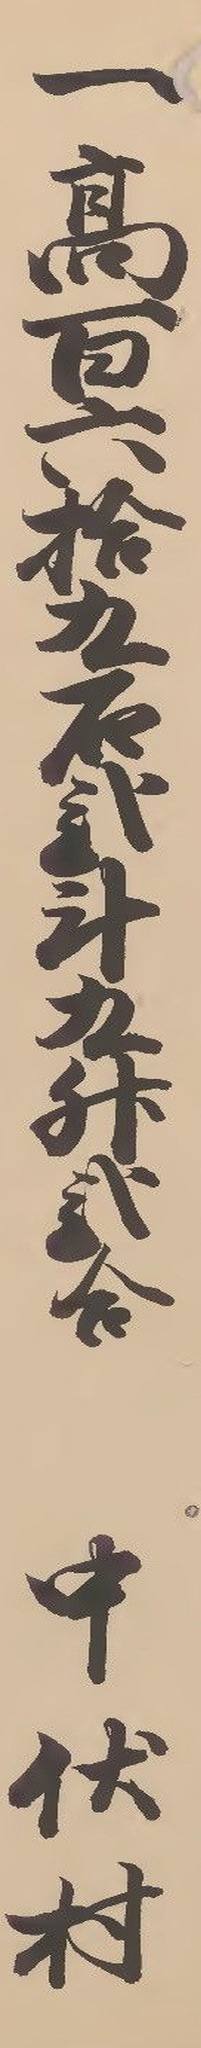一高百六拾九石弐斗九升弐合中伏村
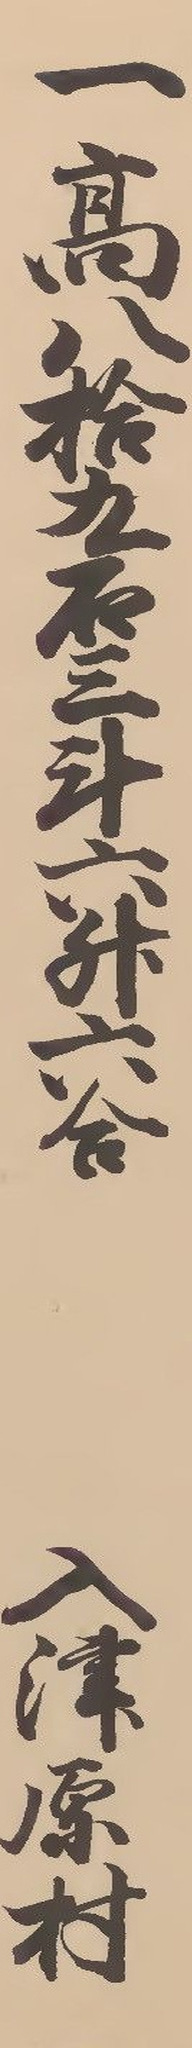一高八拾九石三斗六升六合入津原村
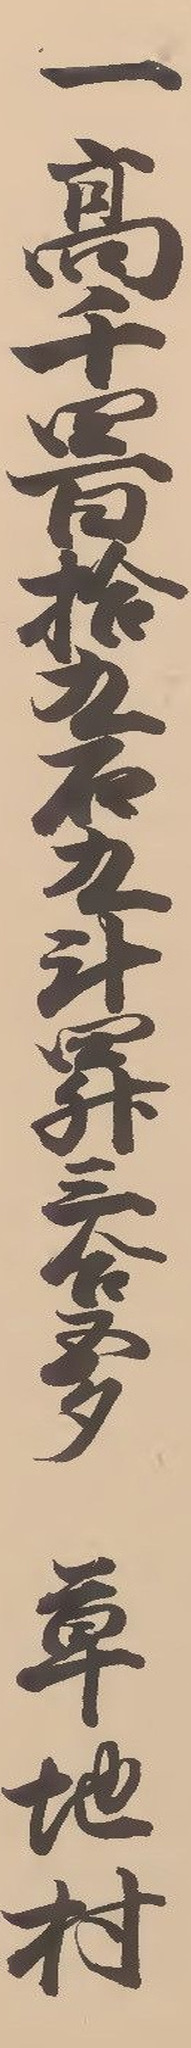一高千四百拾九石九斗四升三合五勺草地村
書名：豊後国郷帳
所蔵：国立公文書館 National Archives of Japan
